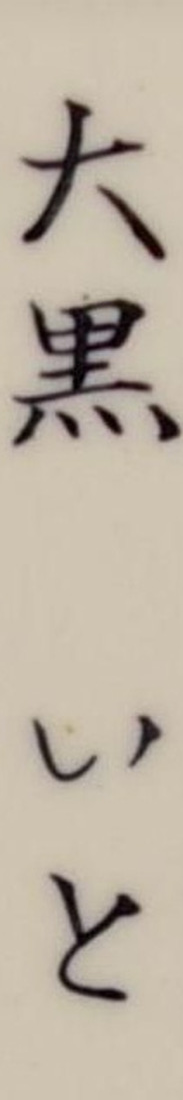大黒いと
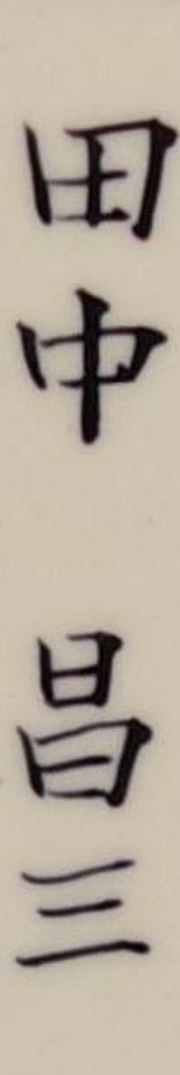田中昌三
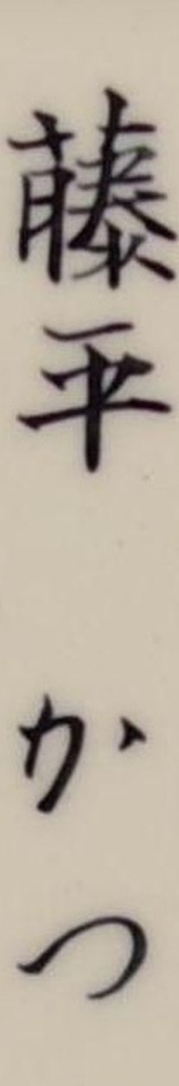藤平かつ
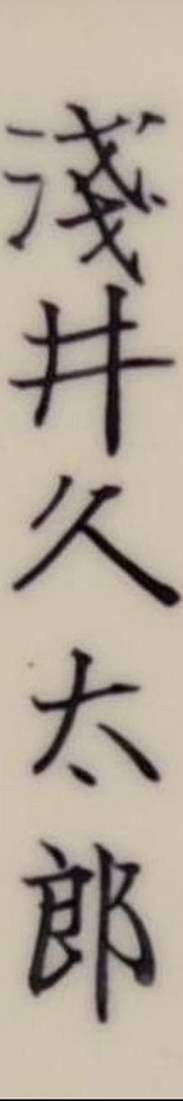浅井久太郎
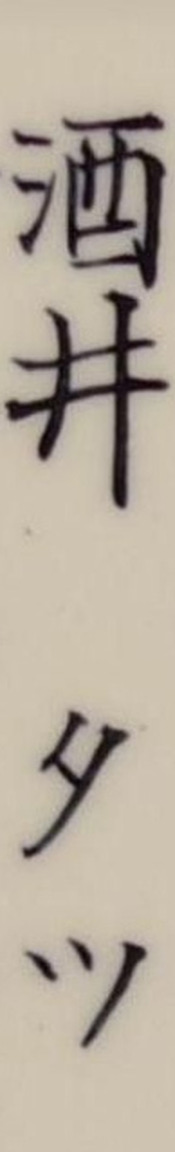酒井タツ
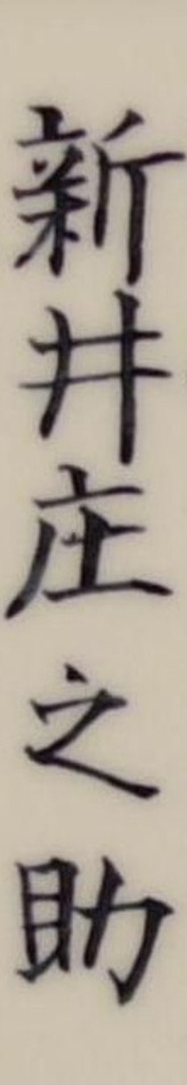新井庄之助
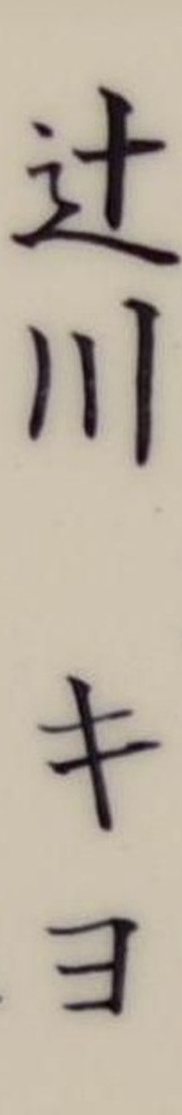辻川キヨ
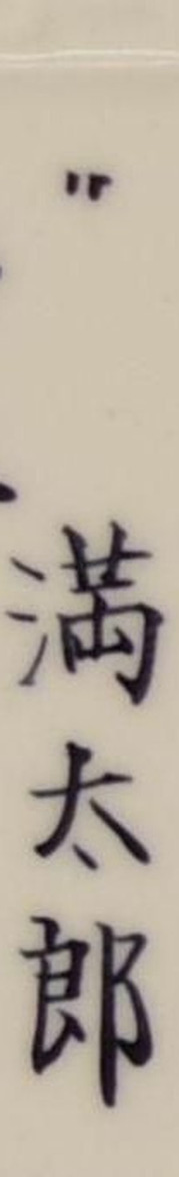満太郎
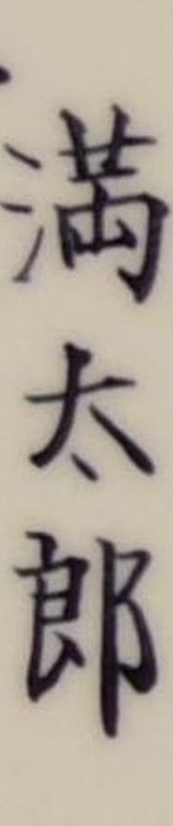満太郎
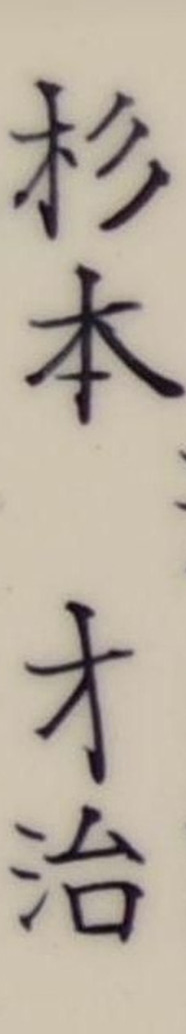杉本才治

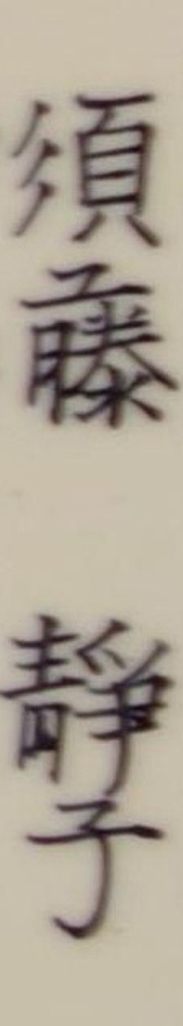須藤静子
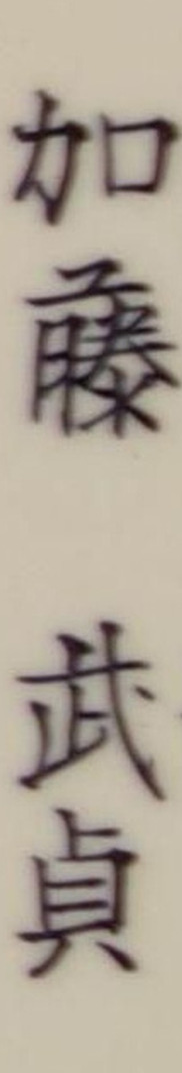加藤武貞
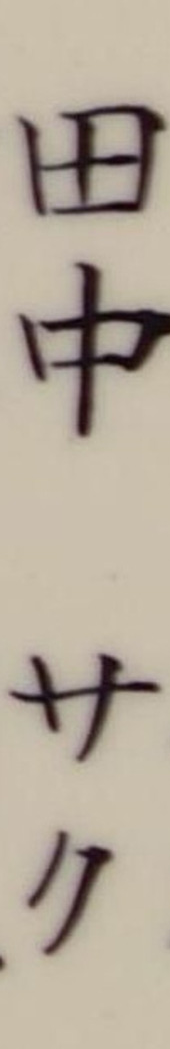田中サク
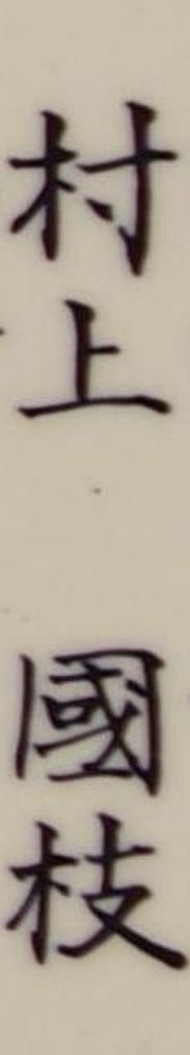村上國枝
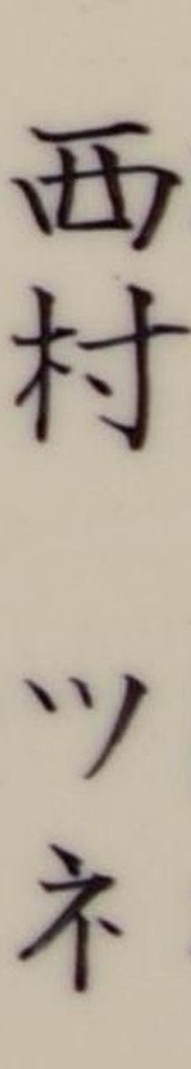西村ツネ
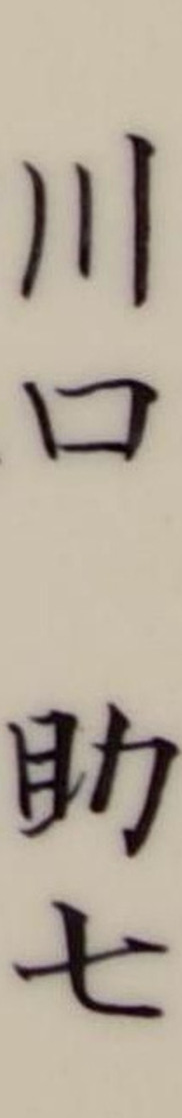川口助七
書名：M~S
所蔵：高野山金剛峯寺
